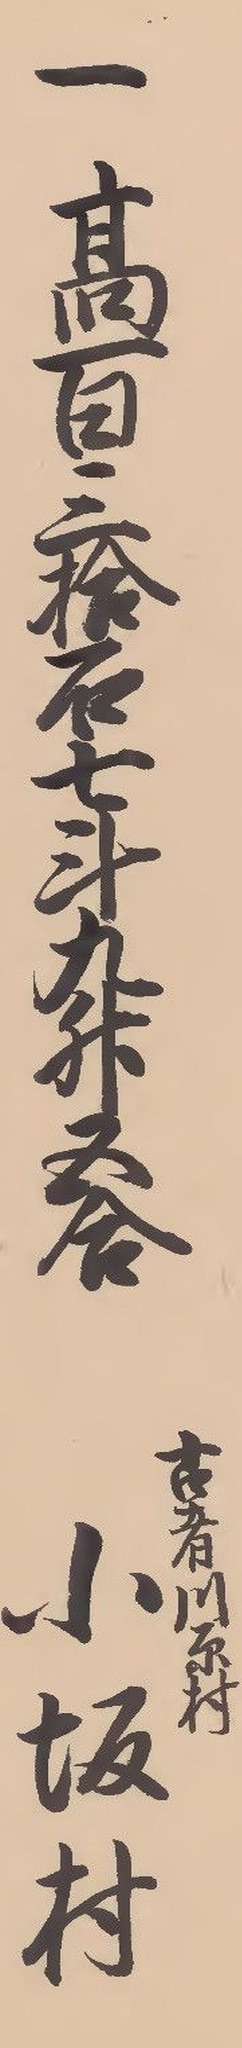一高百三拾石七斗九升五合小坂村
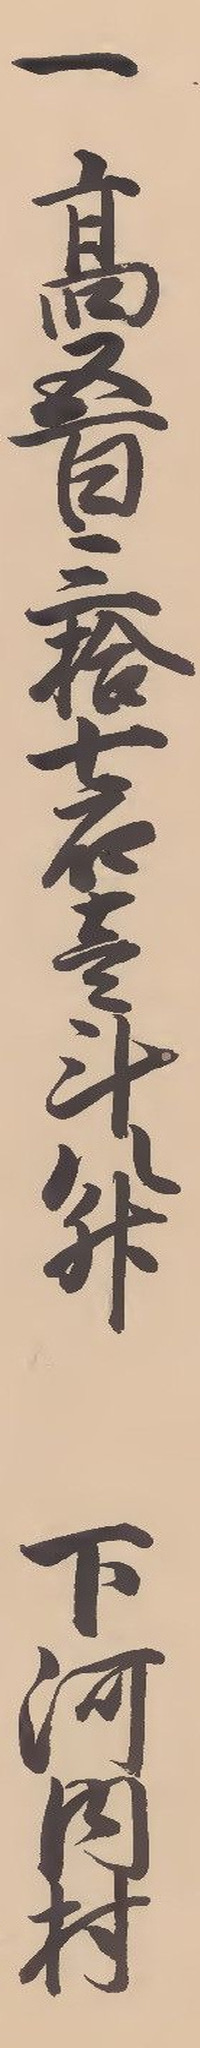一高五百三拾七石壱斗八升下河内村
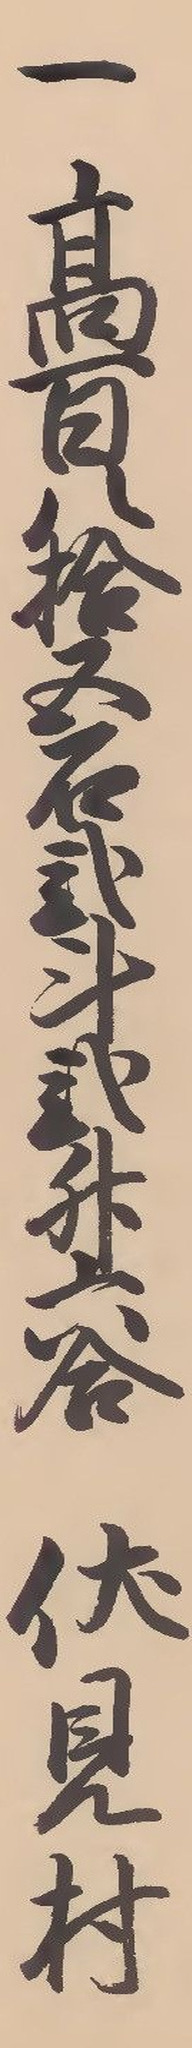一高百八拾五石弐斗弐升六合伏見村

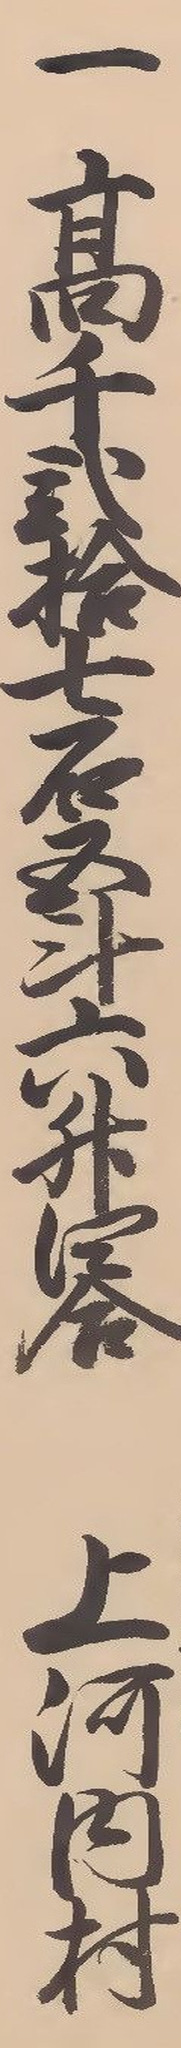一高千弐拾七石五斗六升四合上河内村
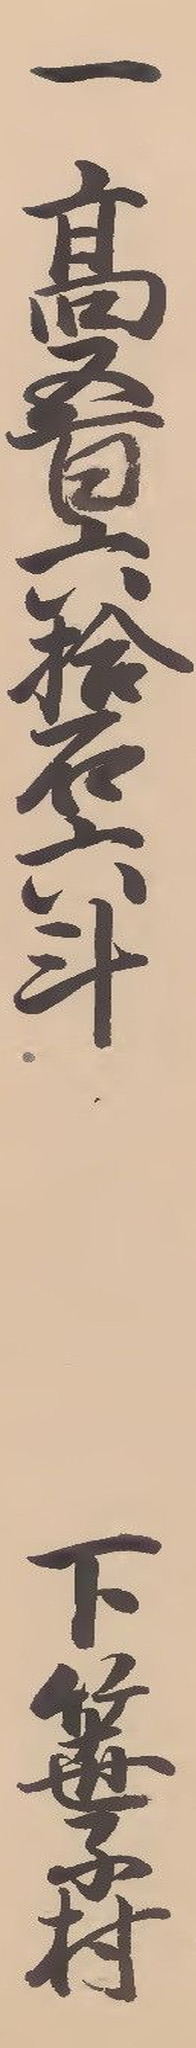一高五百六拾石六斗下笹子村
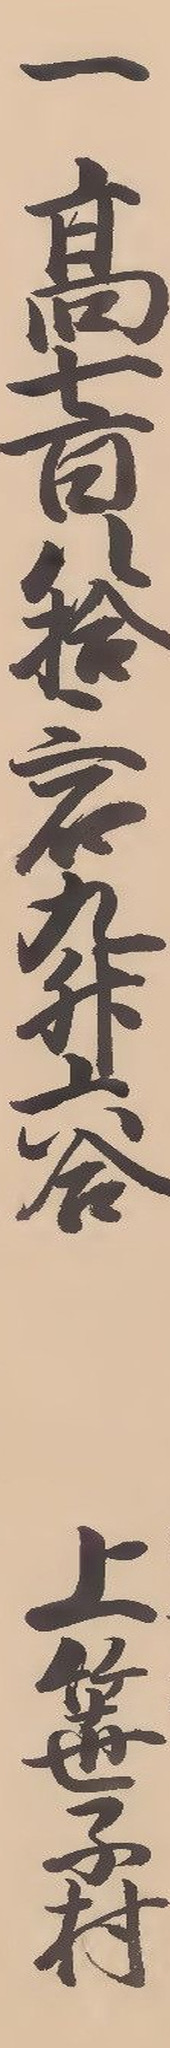一高七百八拾三石九升六合上笹子村
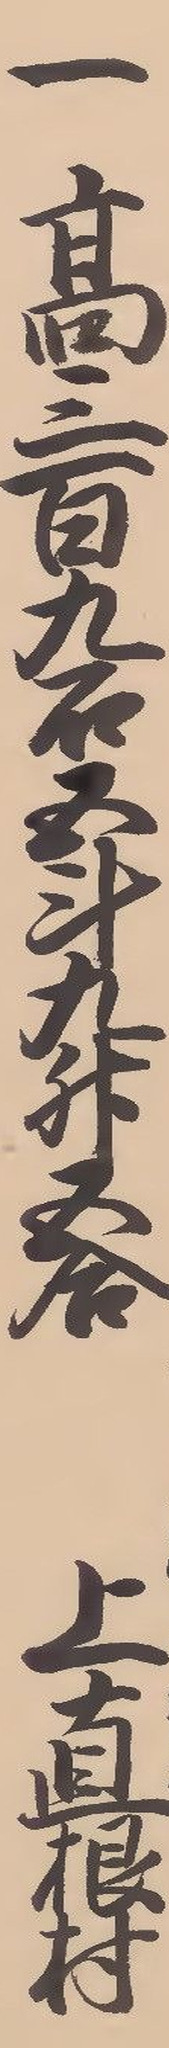一高三百九石五斗九升五合上直根村
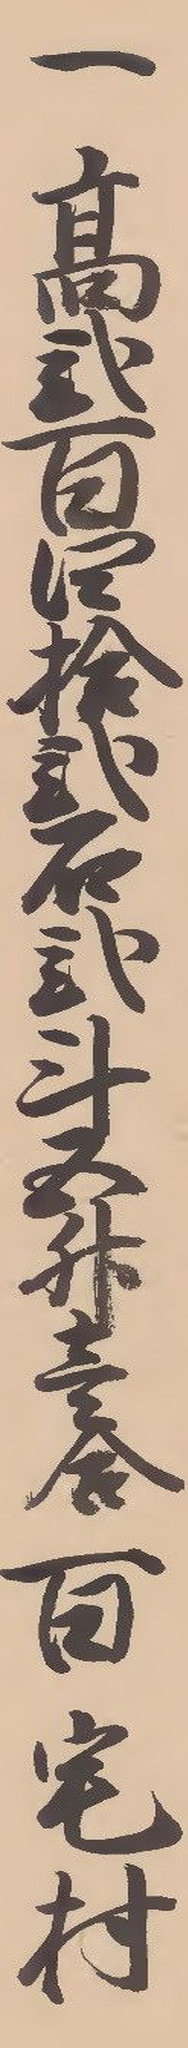一高弐百四拾弐石弐斗五升壱合百宅村
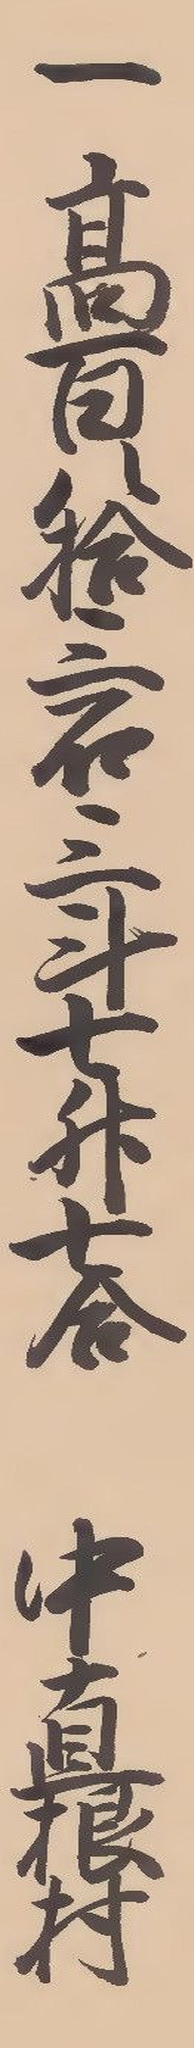一高百八拾三石三斗七升七合中直根村
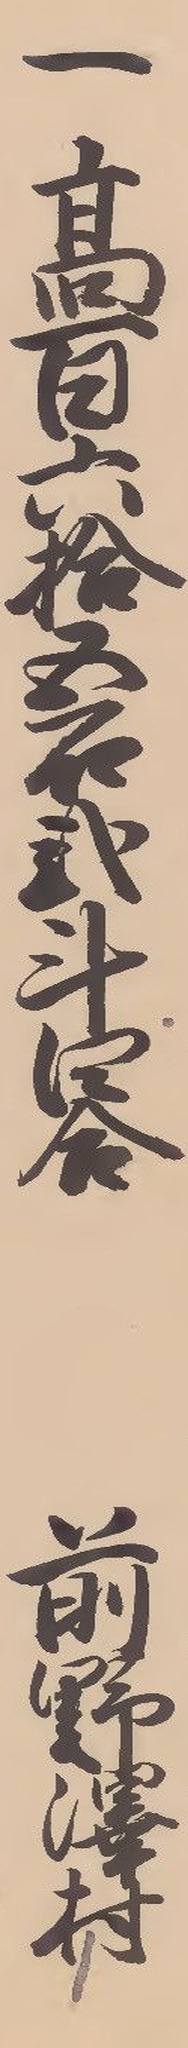一高百六拾五石弐斗四合前野沢村
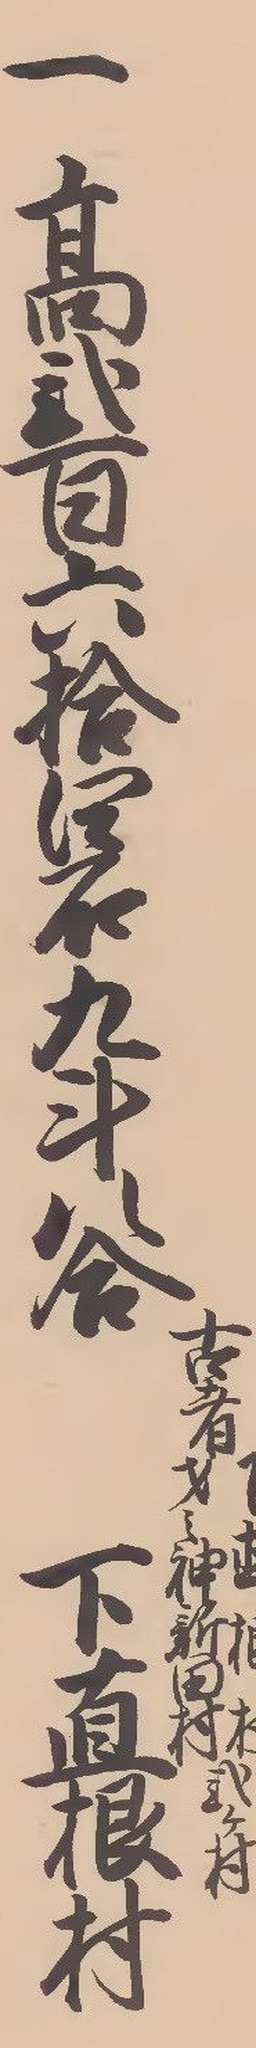一高弐百六拾四石九斗八合下直根村

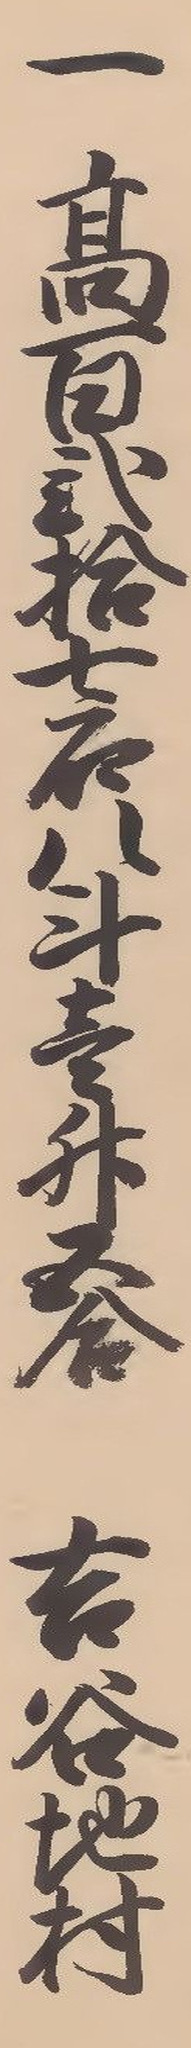一高百弐拾七石八斗壱升五合吉谷地村
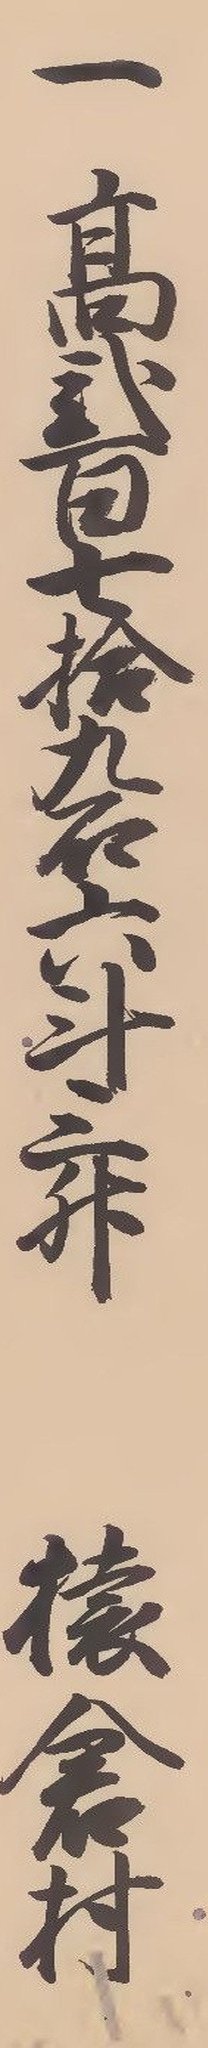一高弐百七拾九石六斗三升猿倉村
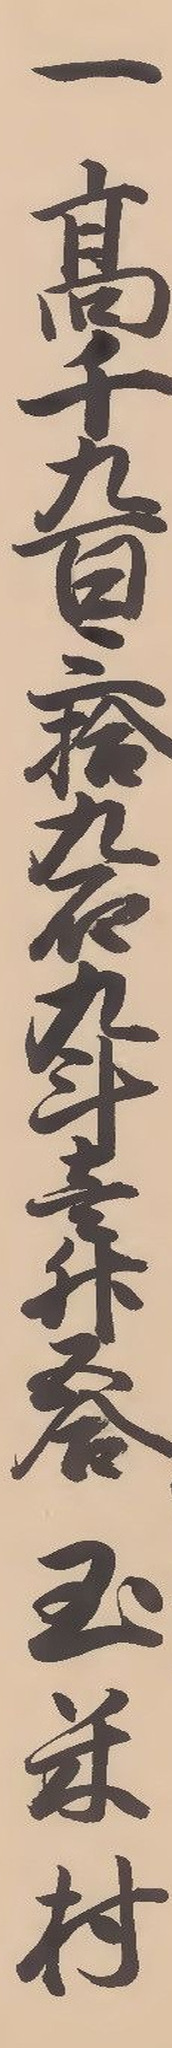一高千九百三拾九石九斗壱升五合玉米村
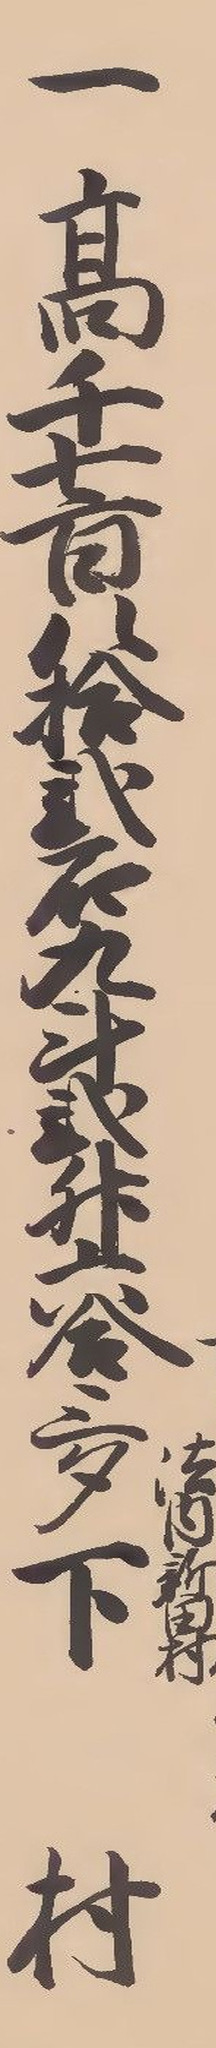一高千七百八拾弐石九斗弐升六合三勺下村
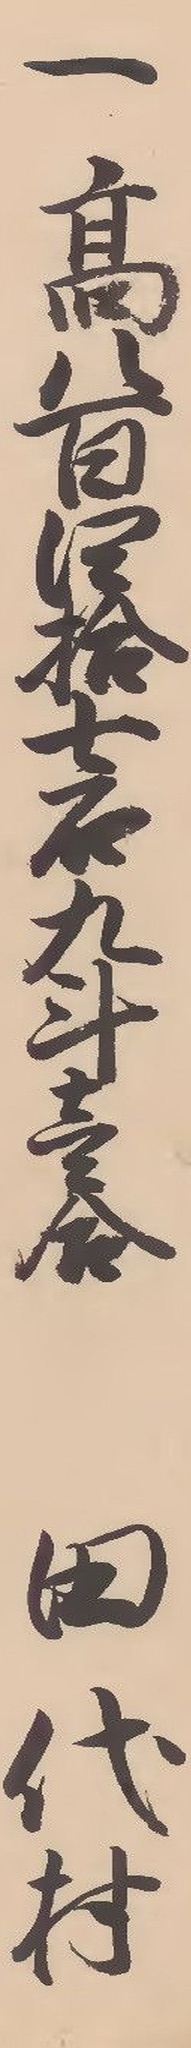一高八百四拾七石九斗壱合田代村
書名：出羽国郷帳　５
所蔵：国立公文書館 National Archives of Japan
